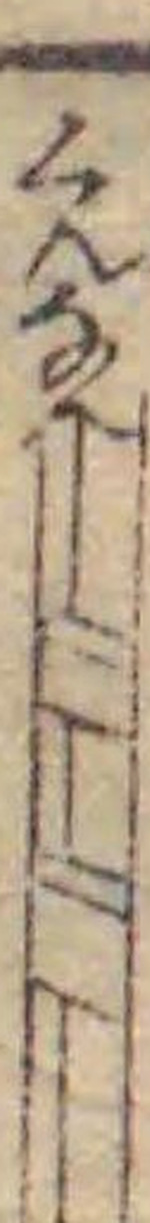くんなんし
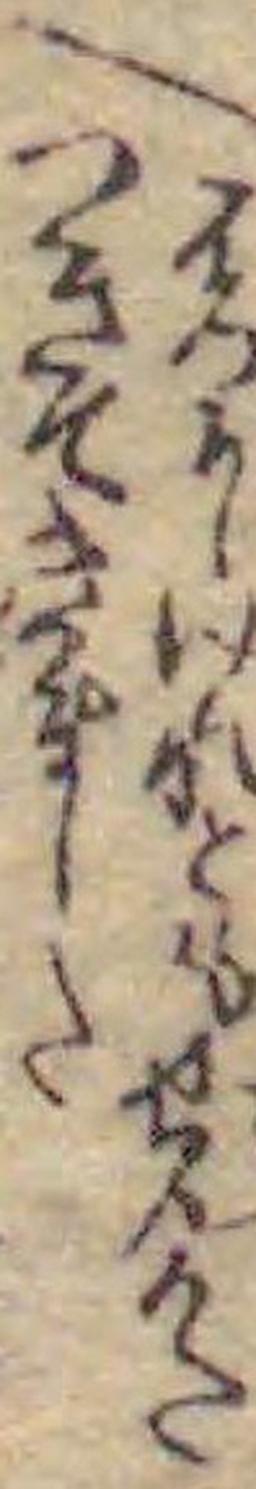つきてきました
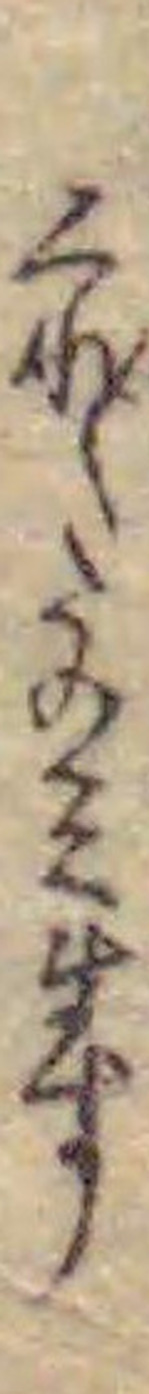くれ〳〵たのみます

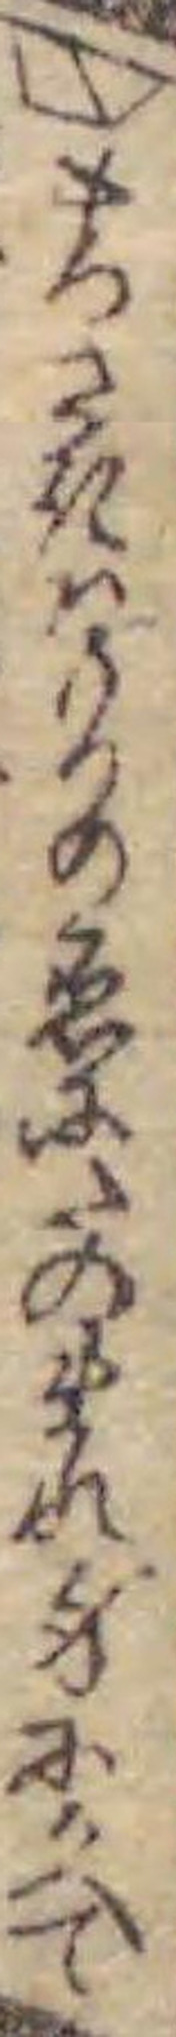まつさきはもりの丞にたのまれ身にかへて
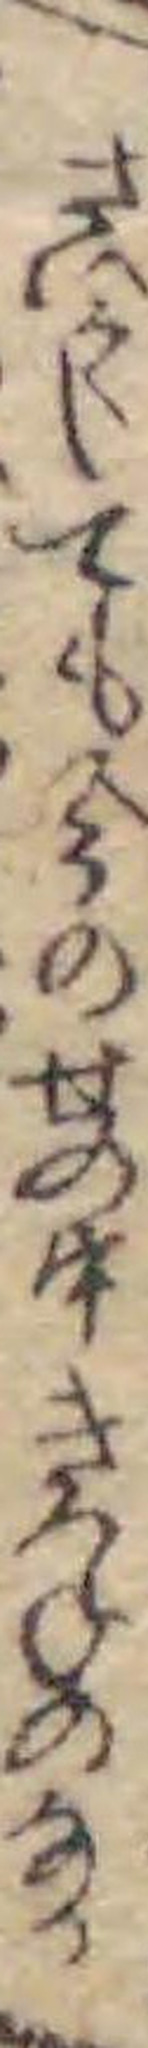さいかくしても今の世の中きつねのなか
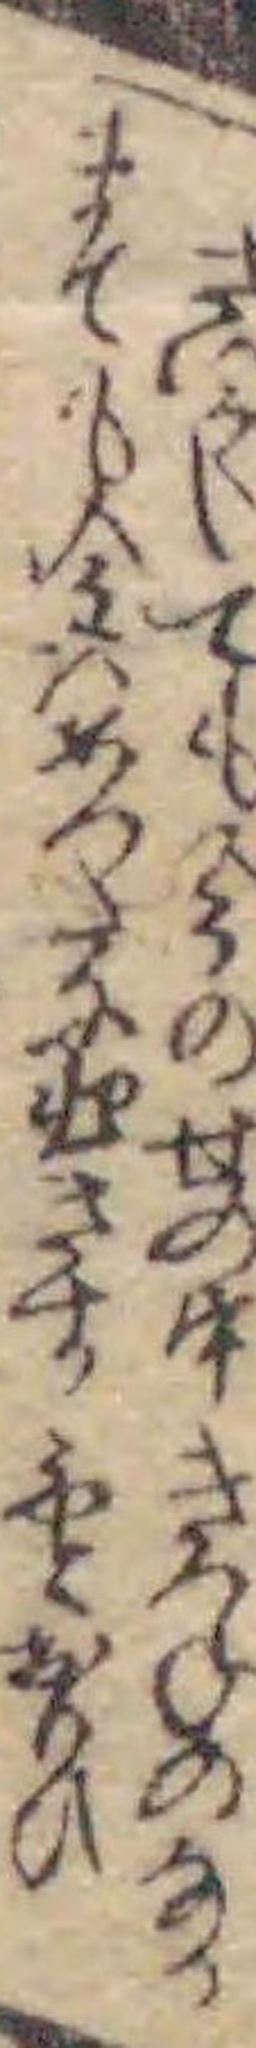まても金はめつたに出きすふとおもひ
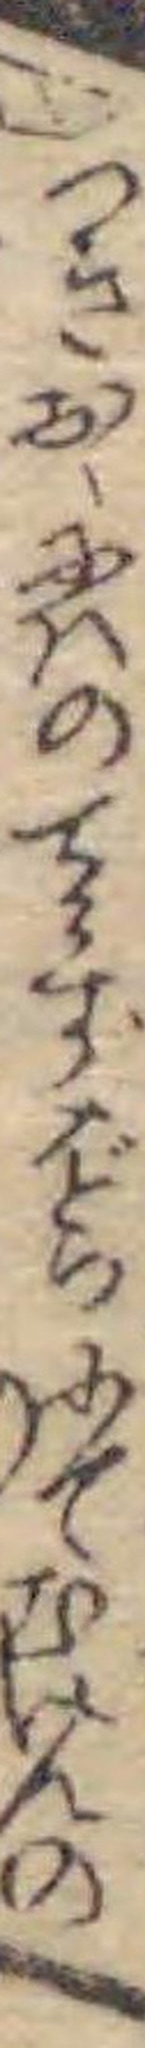つきおゝにはのてうすばちにてむけんの
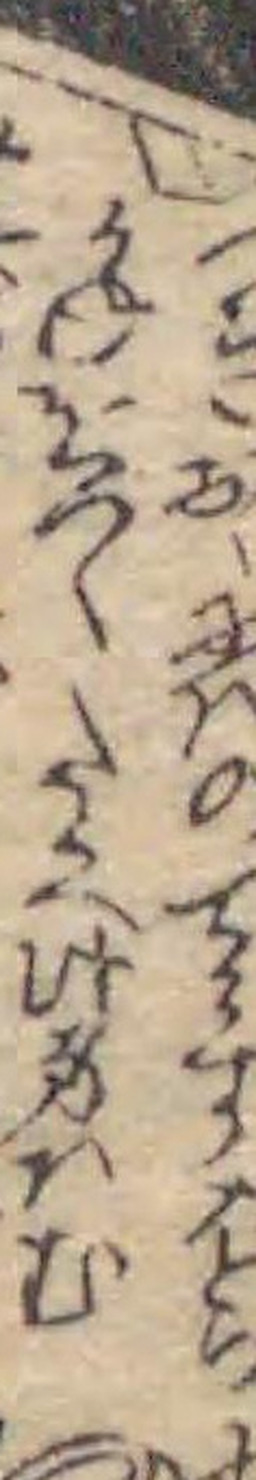かねをつくたとへ此身は
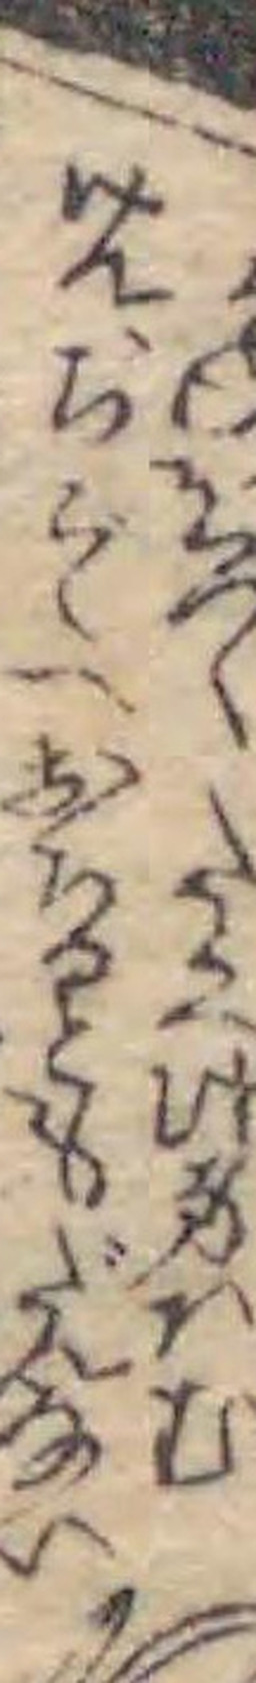むけんちこくへおちるともだんない
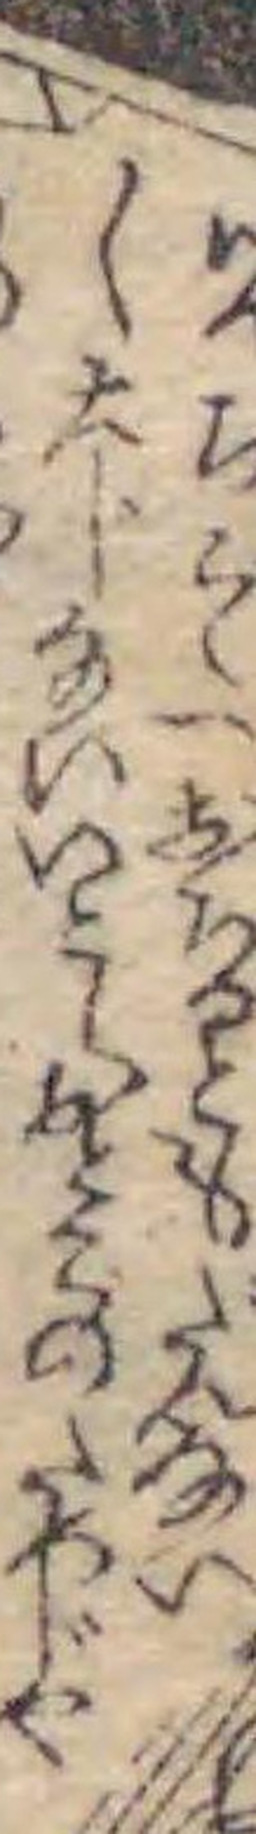〳〵大じないいとしおとこのためじや
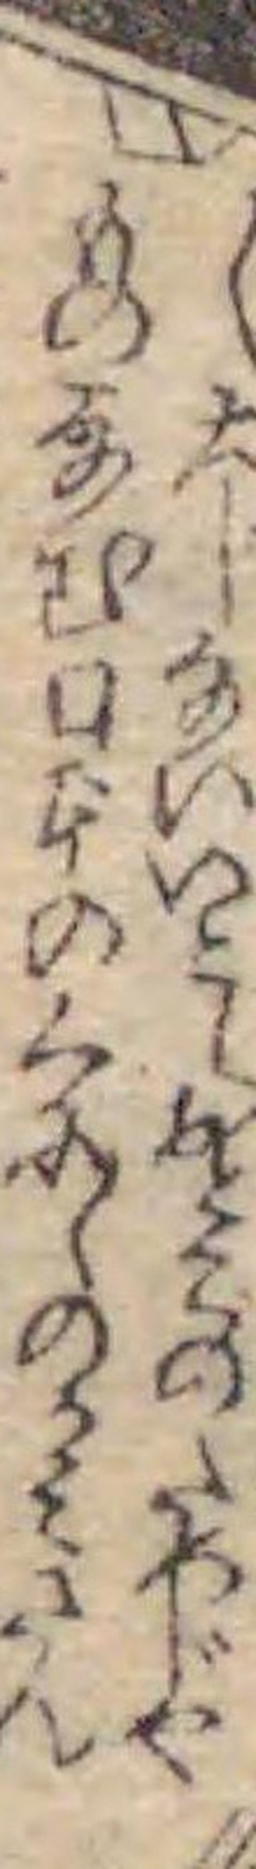ものなむ日本のくに〳〵のかみさん
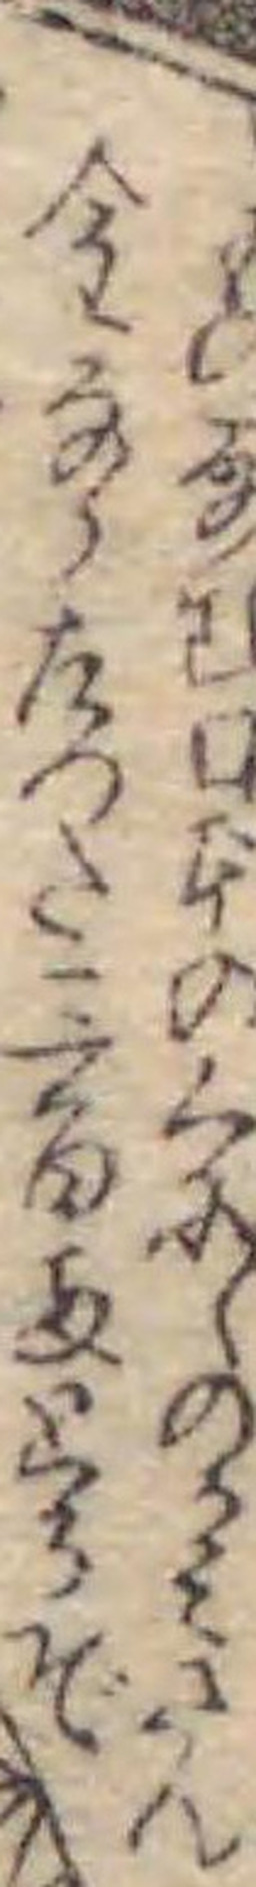金ならたつた三百両とうぞ
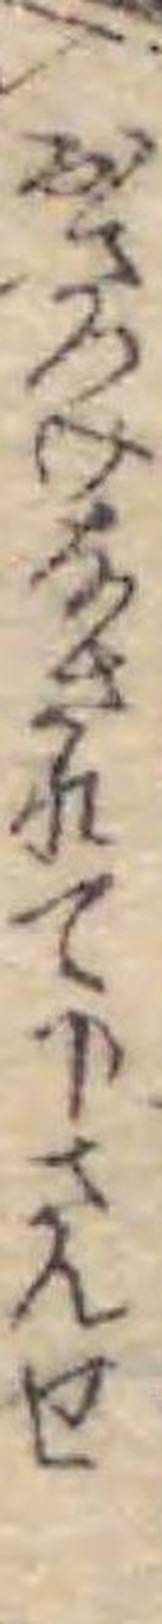おさつけなされて下さんせ
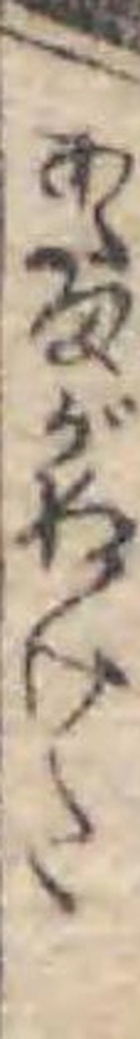あたまがぬけた
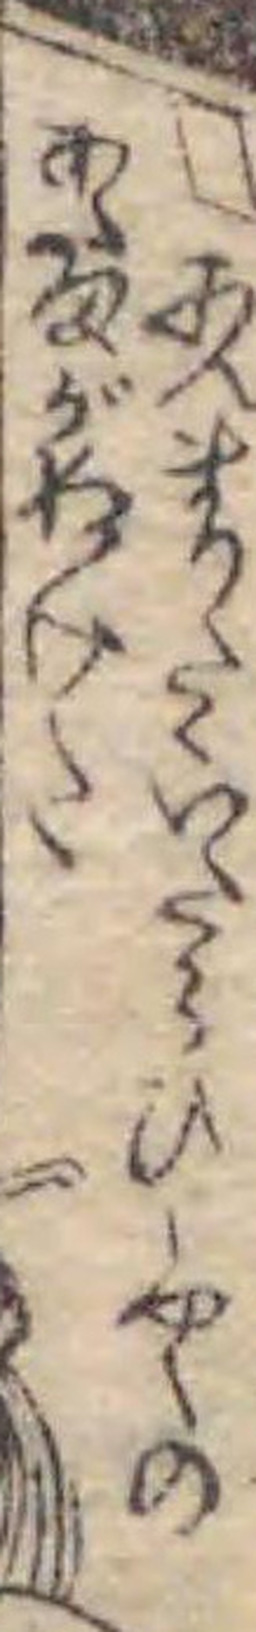あたまがぬけた
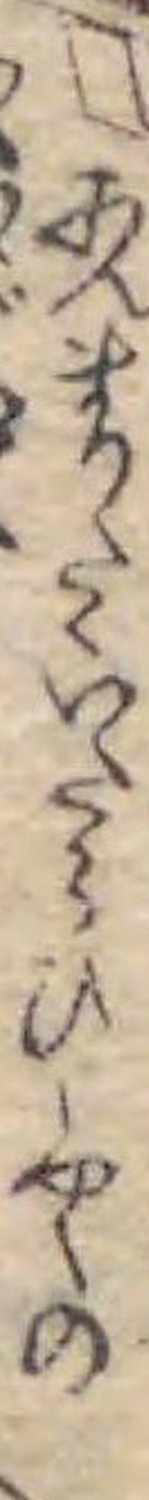あんまりたゝいたらひしやくの
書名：扨化狐通人 : 2巻
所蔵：国立国会図書館 National Diet Library, JAPAN
